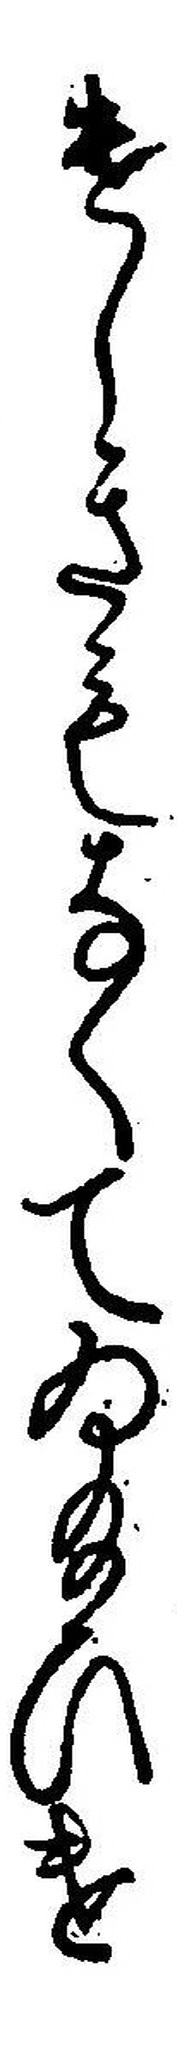けしきもなくてゐ給ひけ
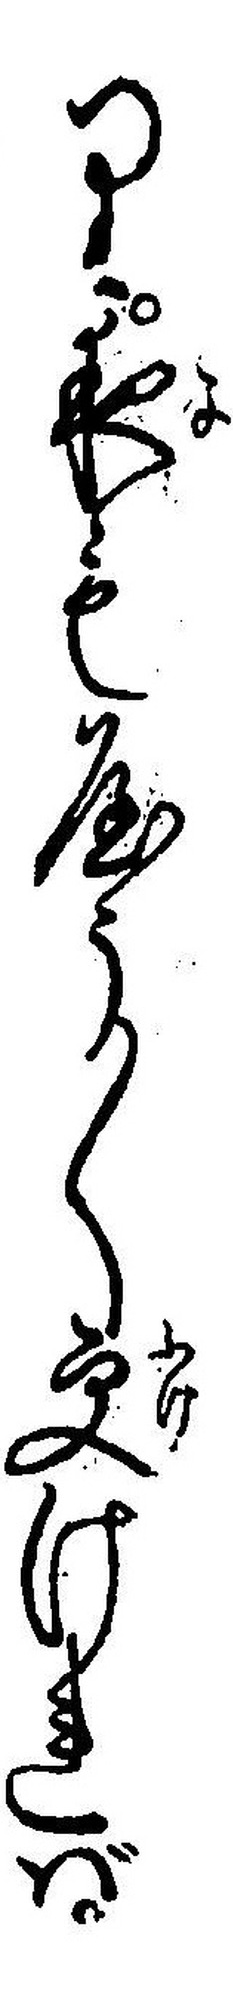り。夜もやう〳〵更ければ。
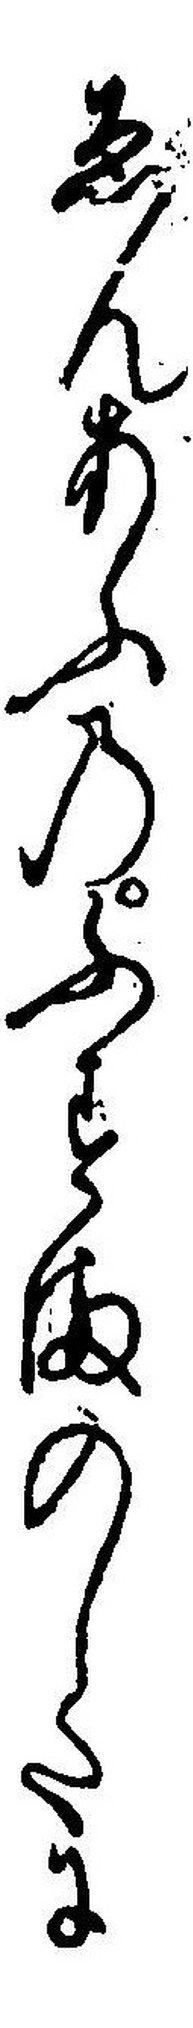ゑんあふの。ふすまのしたに
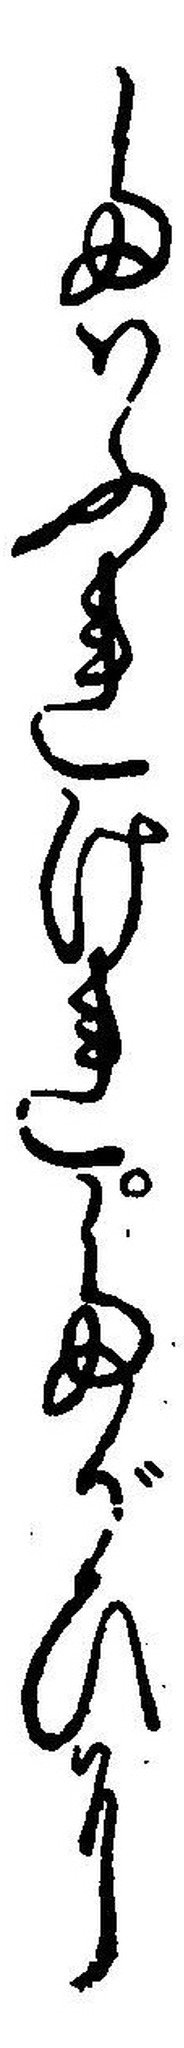たはふれけれ。たがひに
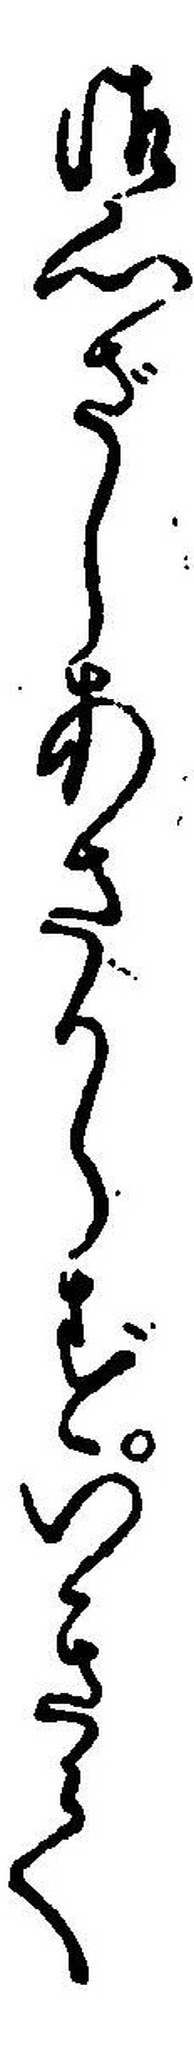御心ざしあさからず。いきて
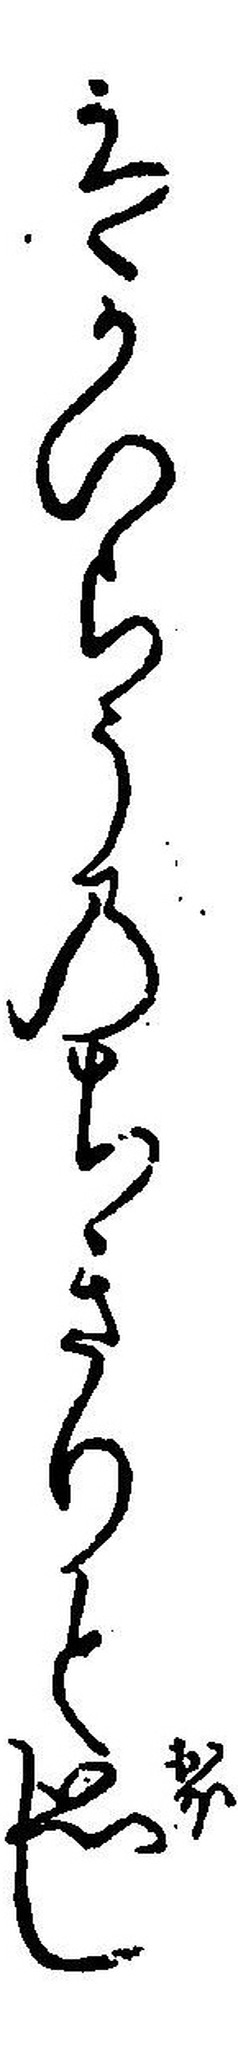はかいらうのちきりと思し
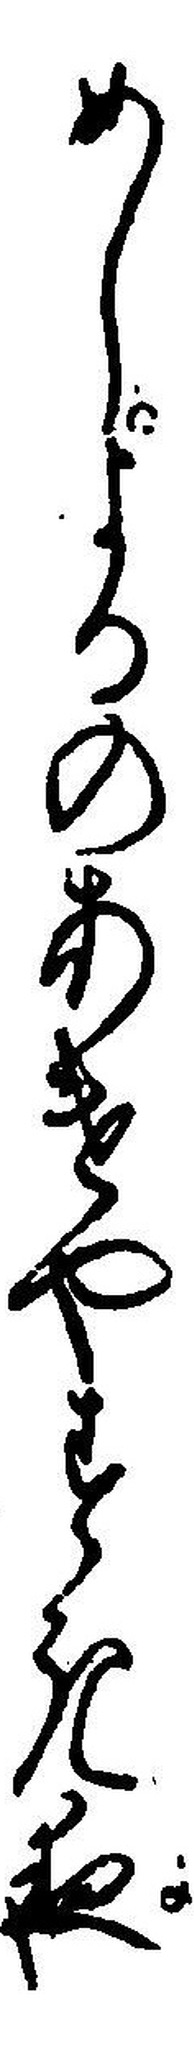めし。よろのあけやすき夜
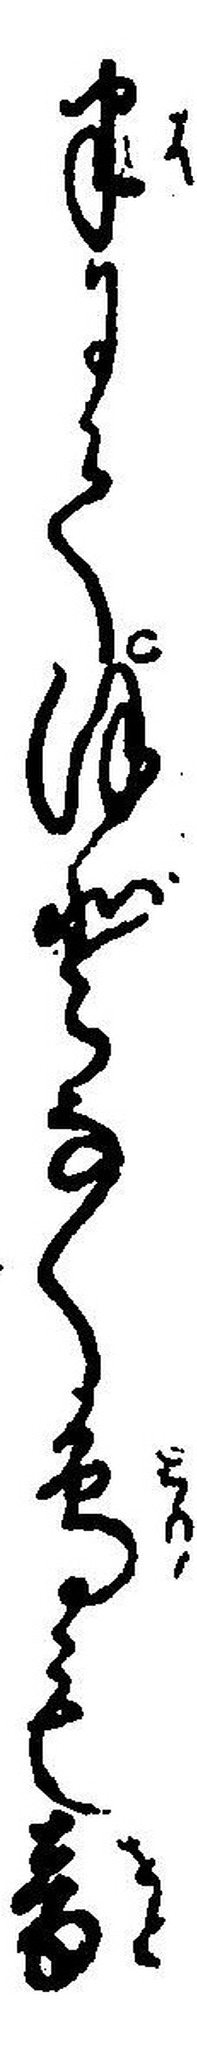半にて。ほどなく鳥も音
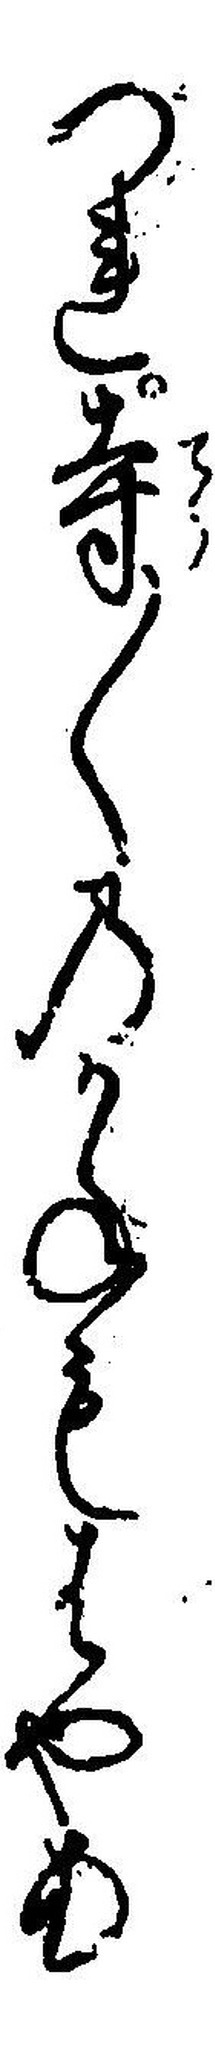づれ。寺〳〵のかねもはやあ
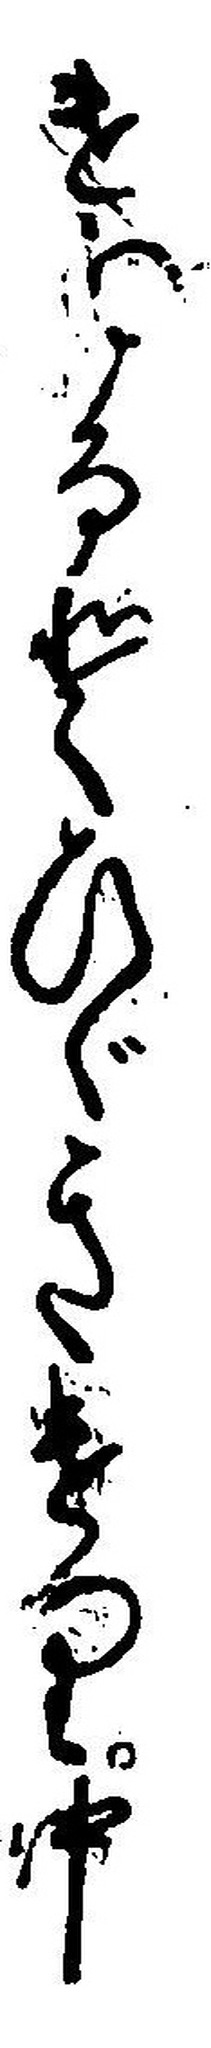けぬるとひゞきけり。中
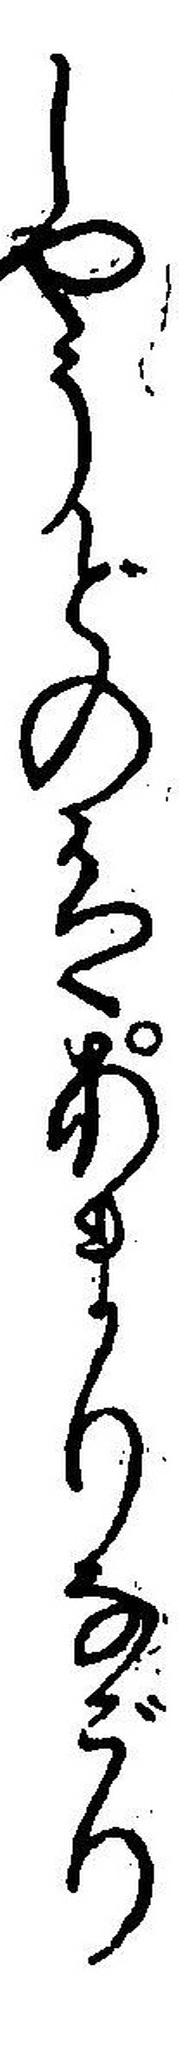しやうどのは。あまりなごり
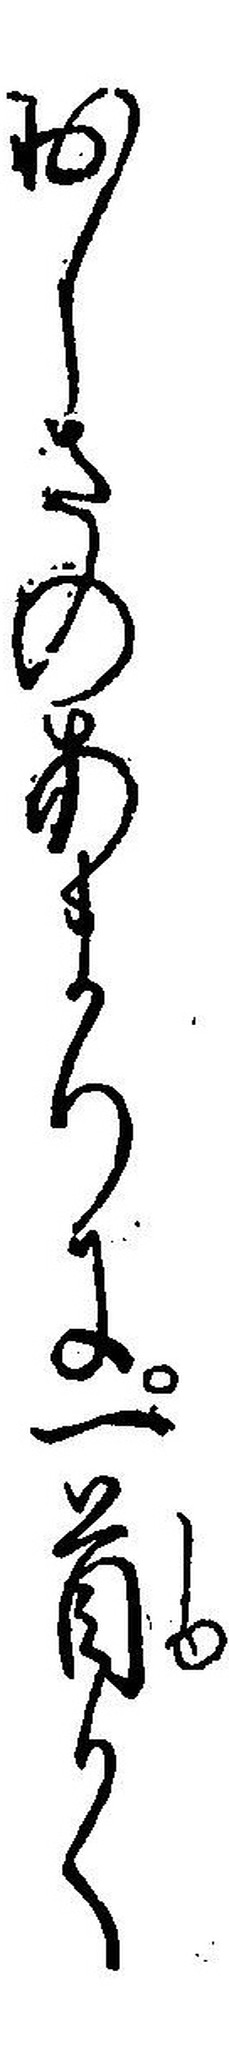おしさのあまりに。一首かく
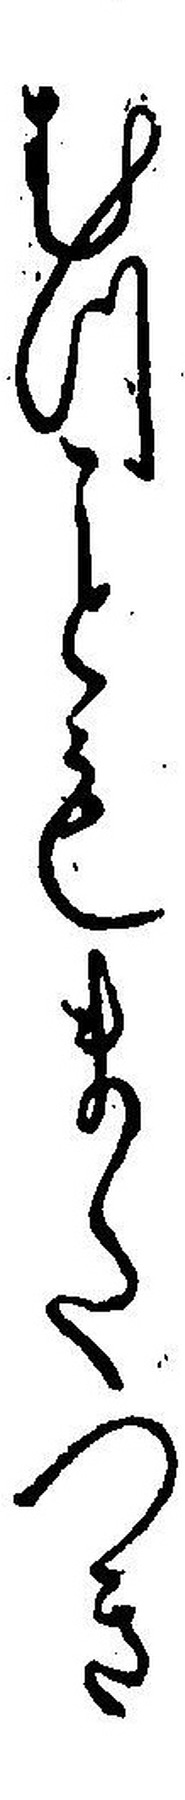むつこともまたつき
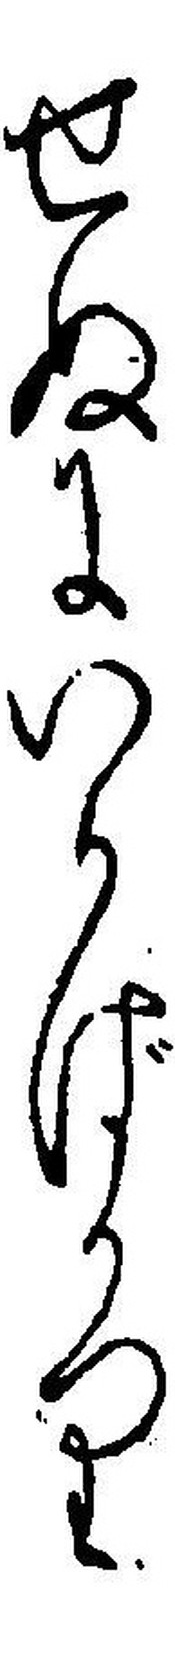せぬにいかばかり
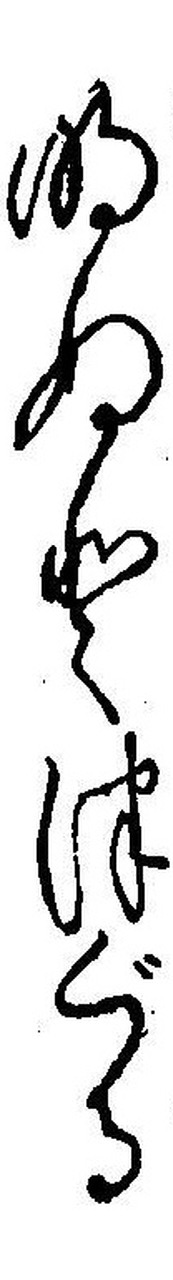明ぬとつぐる
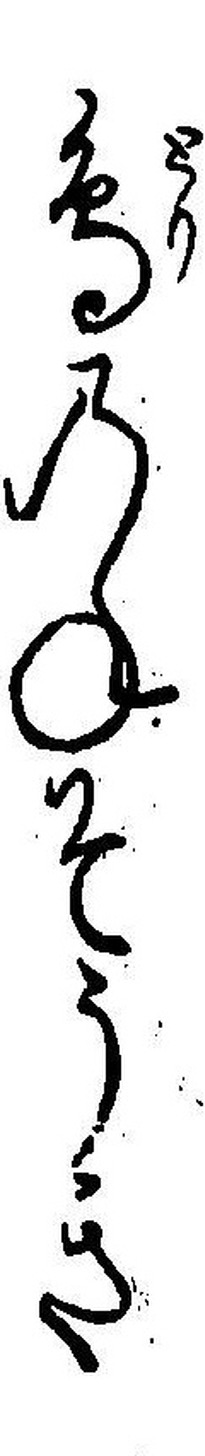鳥のねそうき
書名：木幡きつね
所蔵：東京大学総合図書館 General Library in the University of Tokyo, JAPAN
